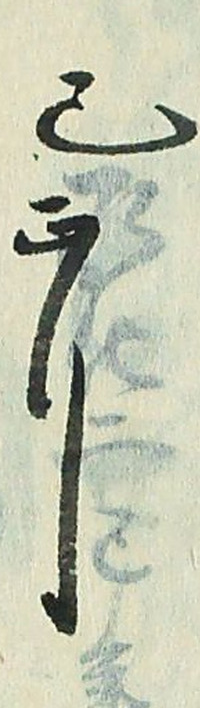巳正月
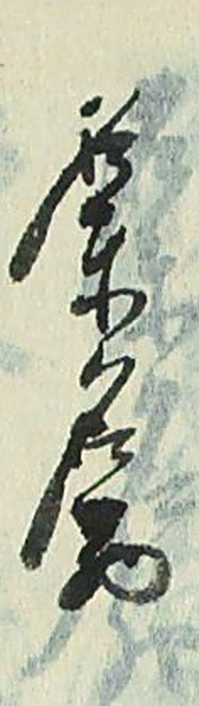名東名西
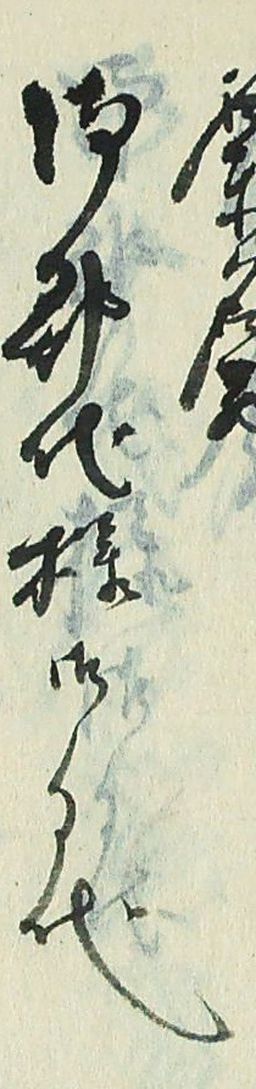御郡代様御手代
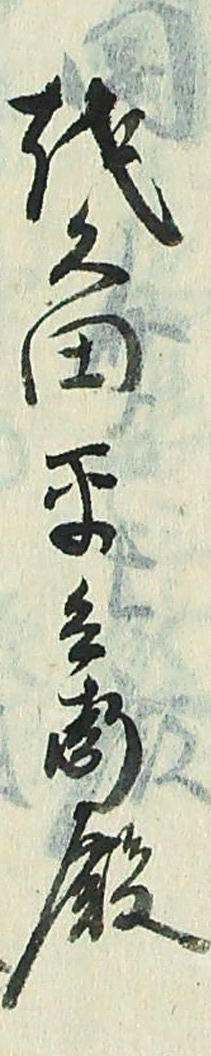越久田平兵衛殿
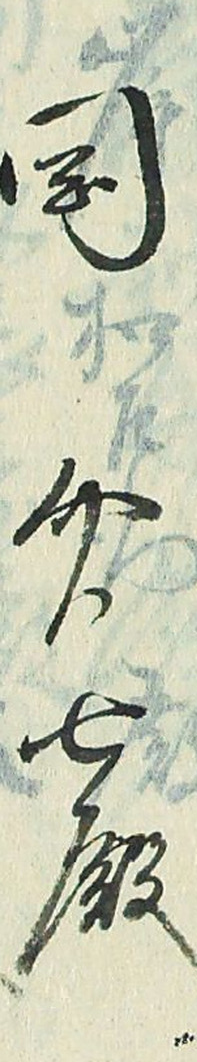岡介七殿
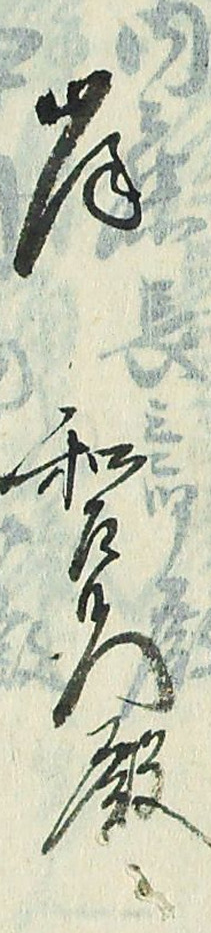岸和左衛門殿

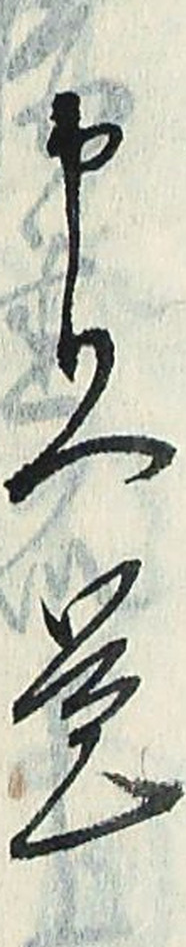申上覚
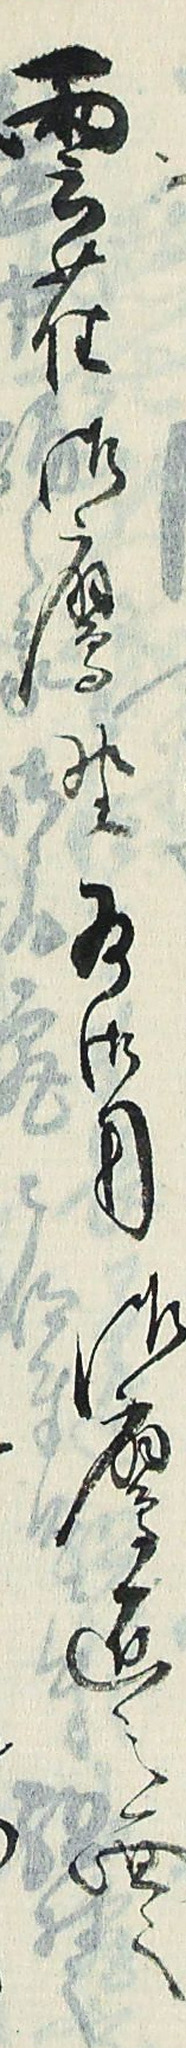雲雀御鷹野為御用御鷹匠之面々
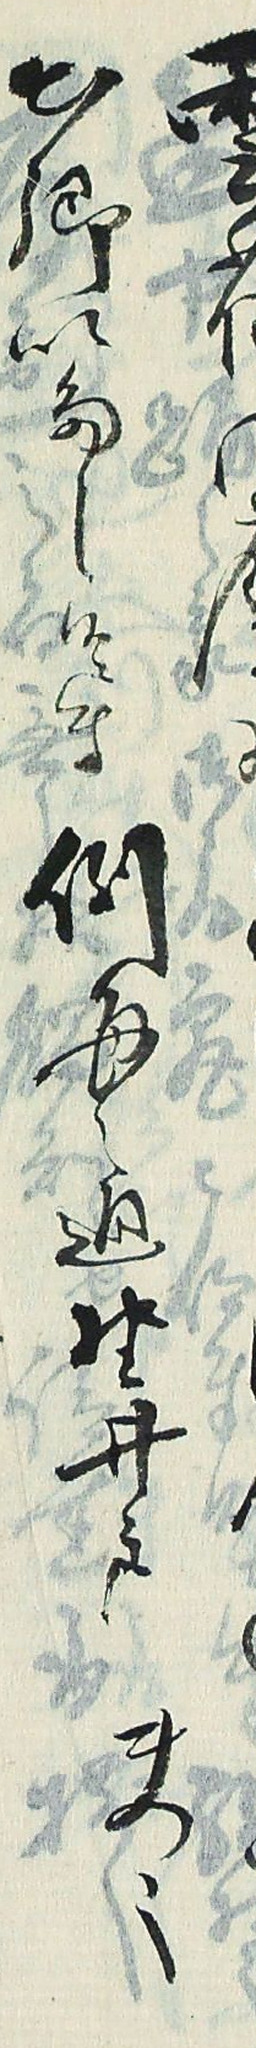出郷いたし候に付例毎之通野井戸夫々
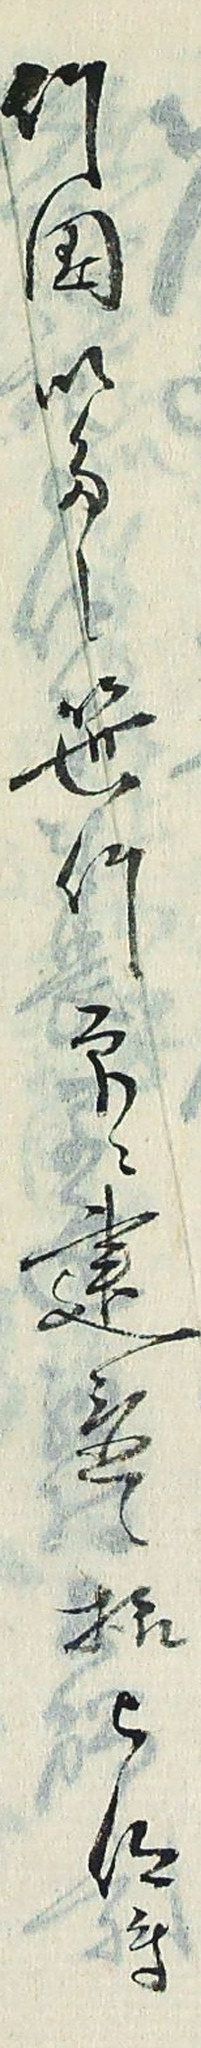竹囲いたし笹竹印に建置候様被仰付
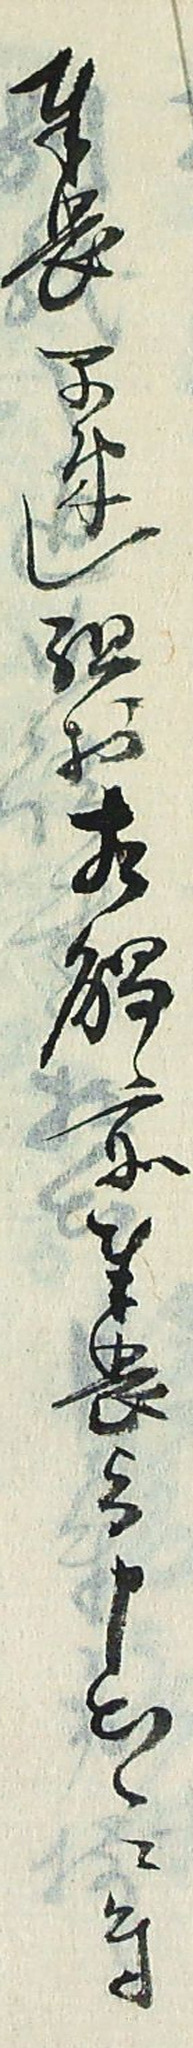奉畏早速組村相触候所奉畏旨申出候に付
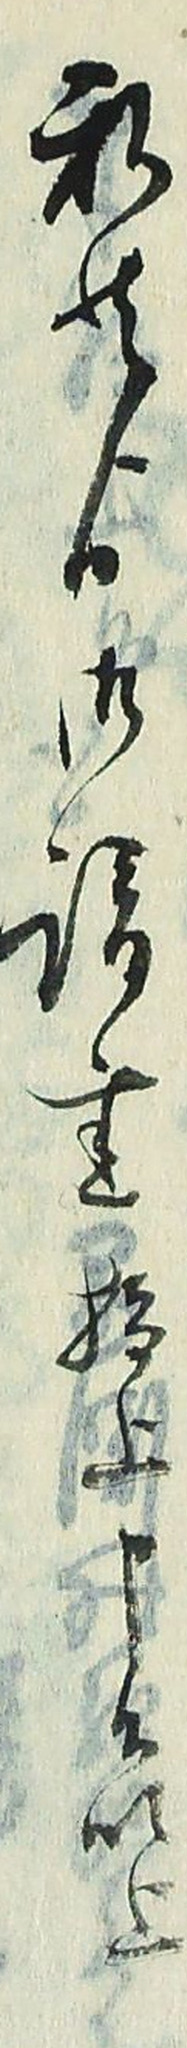私共ゟ御請書指上申候以上
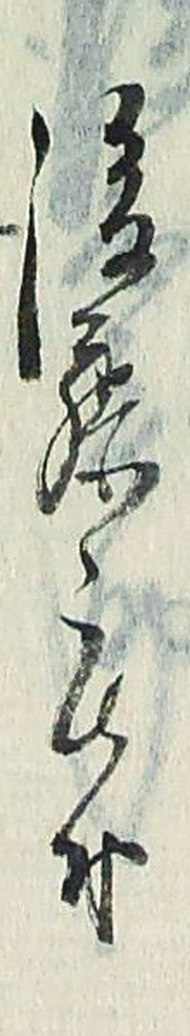後藤庄助
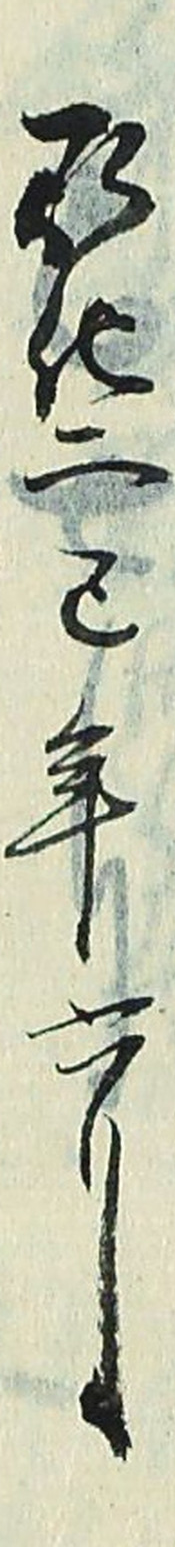弘化二巳年六月
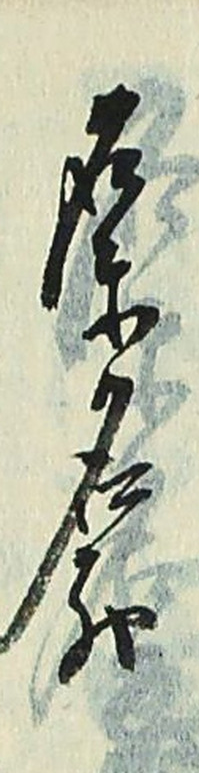名東名西
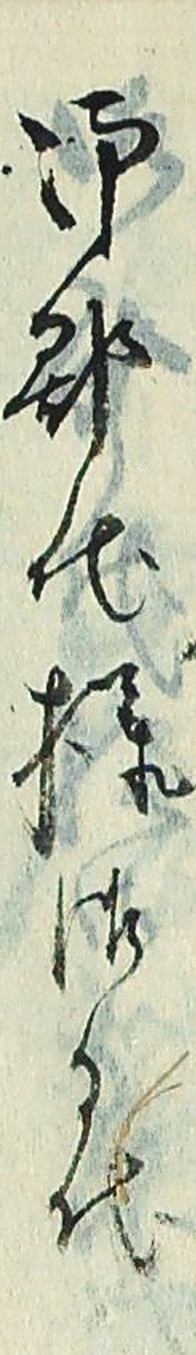御郡代様御手代
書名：諸御用御□受書控
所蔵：鳴門教育大学 Naruto University of Education
